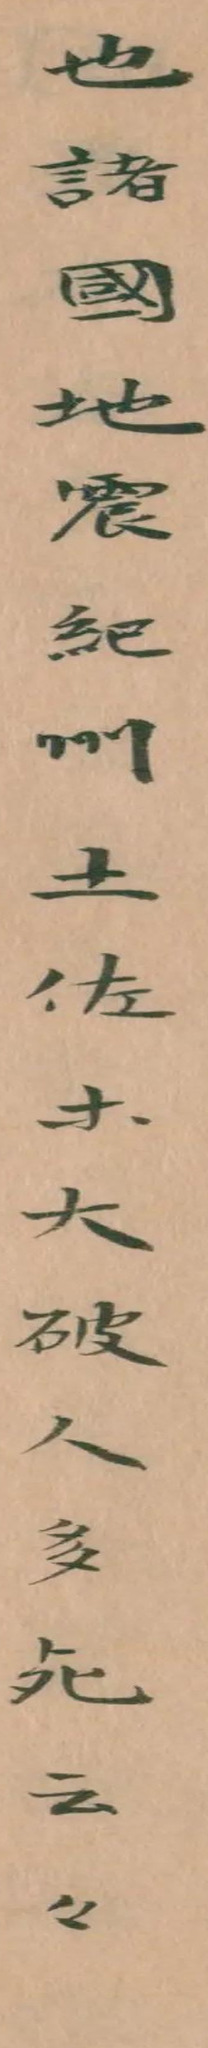也諸国地震紀州土佐等大破人多死云々
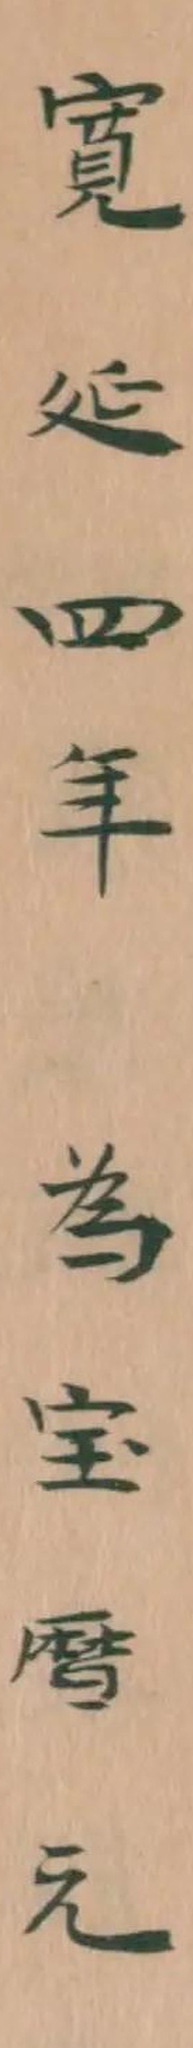寛延四年為宝暦元
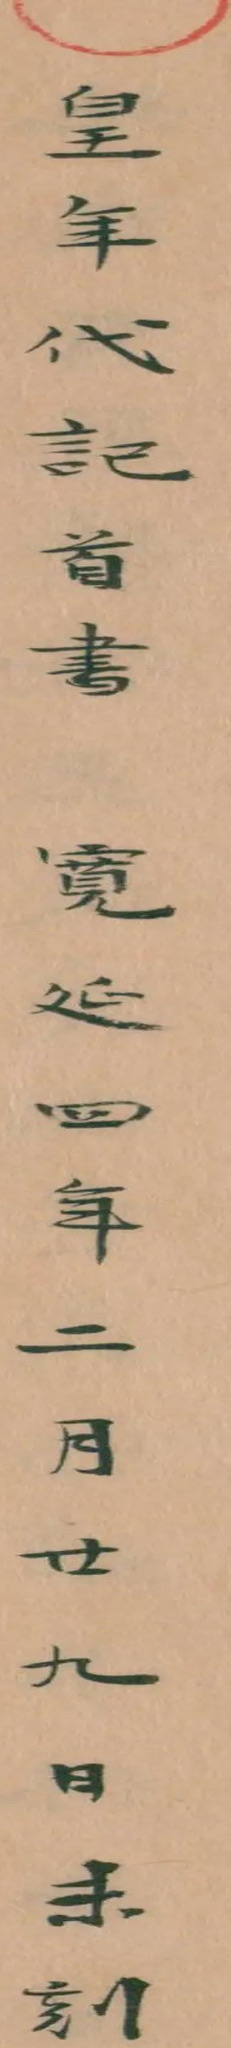○皇年代記首書寛延四年二月廿九日未刻
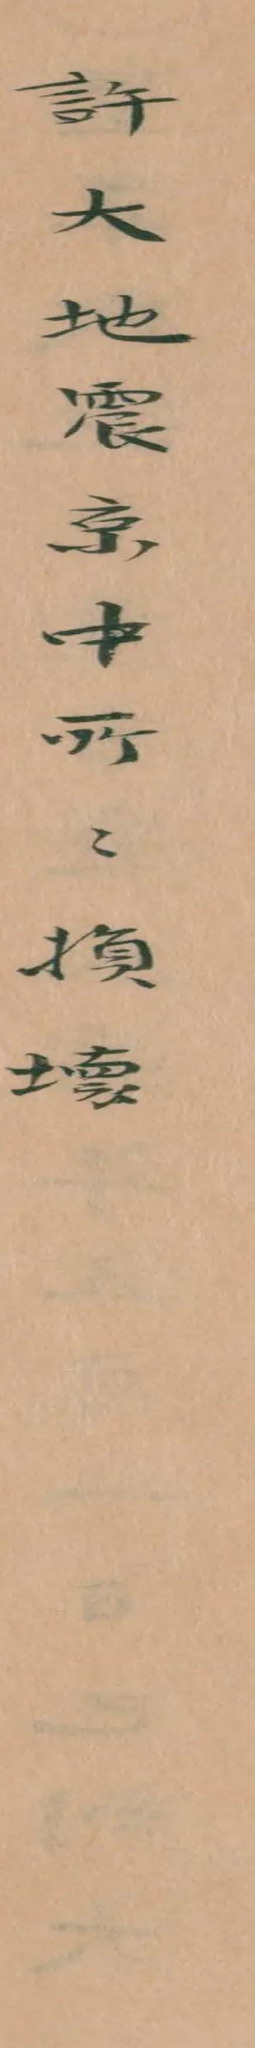許大地震京中所々損壊
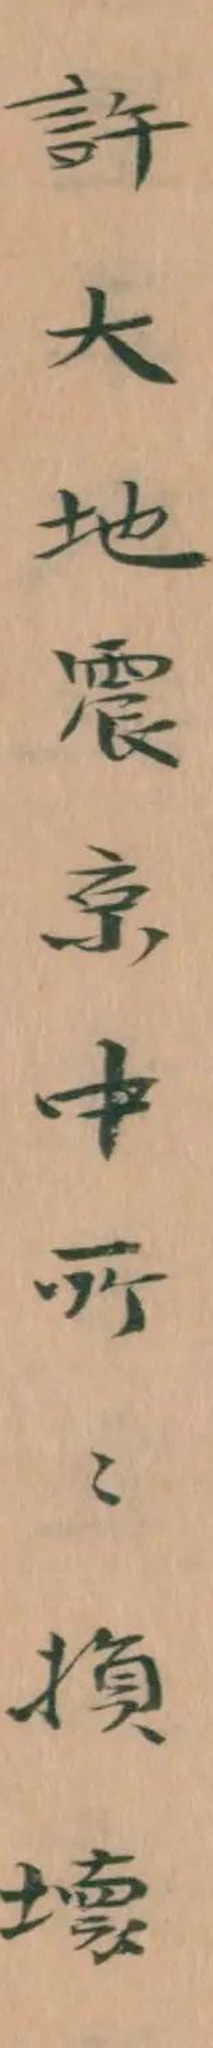許大地震京中所々損壊
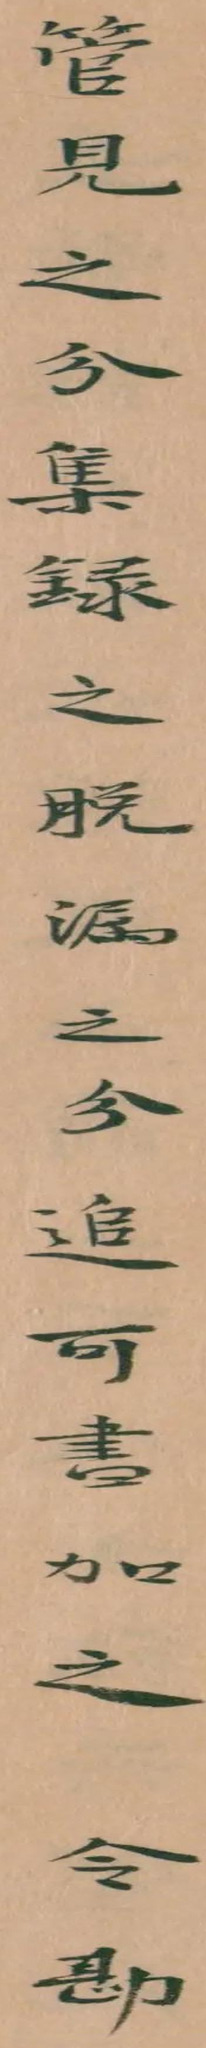管見之分集録之脱漏之分追可書加之令勘
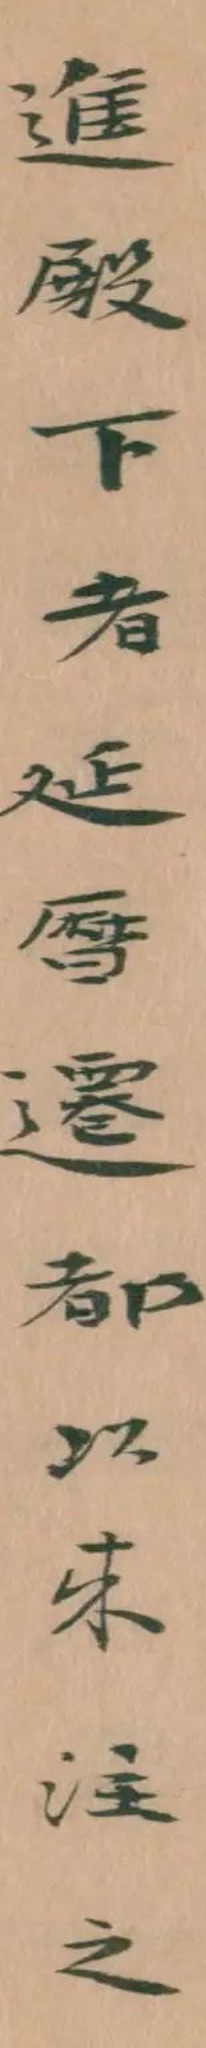進殿下者延暦遷都以来注之

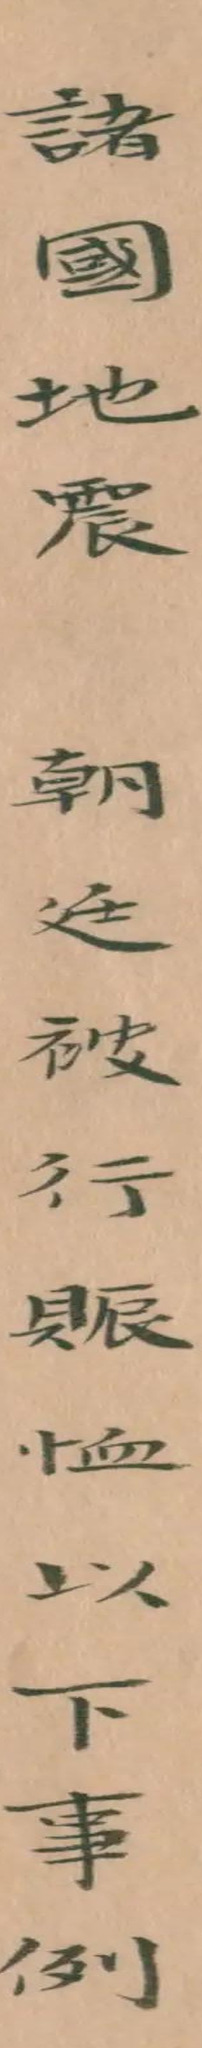諸国地震朝廷被行賑恤以下事例
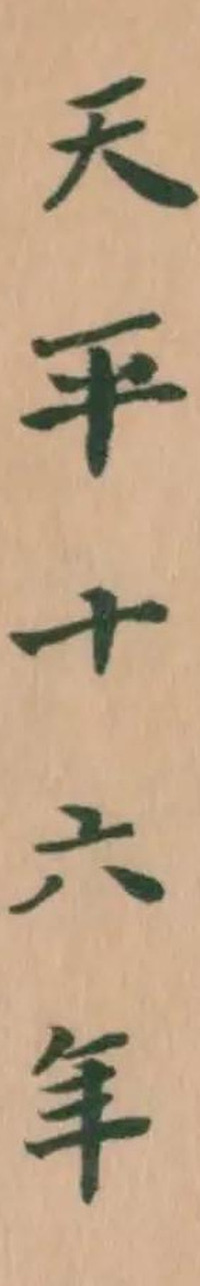天平十六年
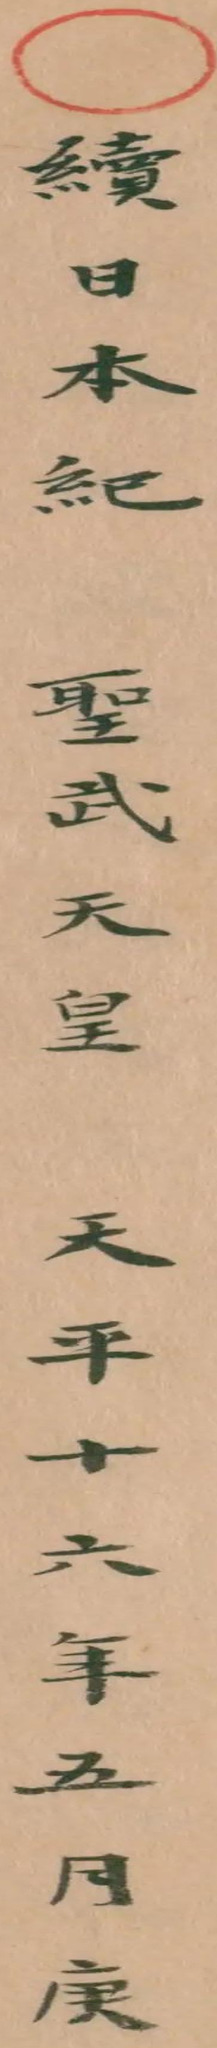○続日本紀聖武天皇天平十六年五月庚
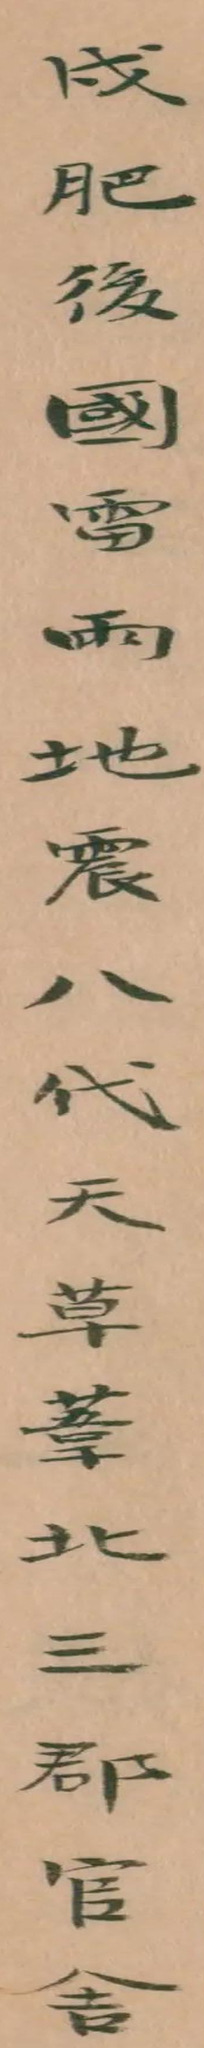戌肥後国雷雨地震八代天草葦北三郡官舎
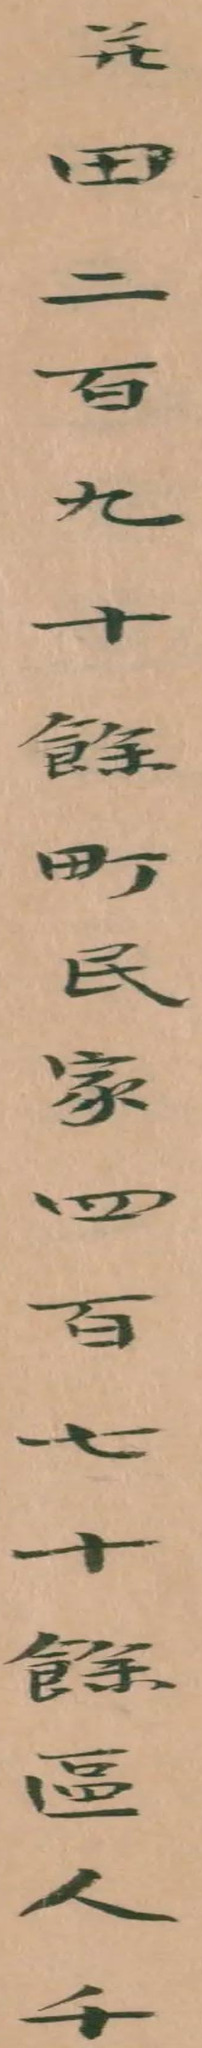幷田二百九十余町民家四百七十余区人千
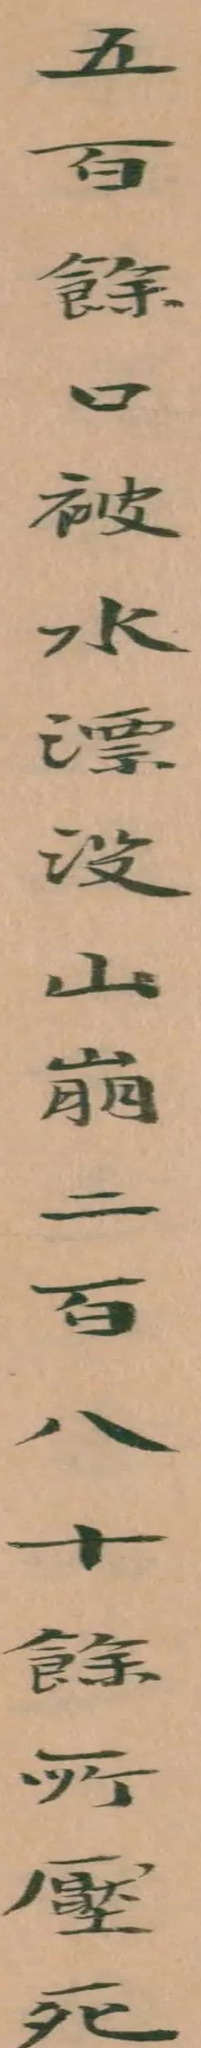五百余口被水漂没山崩二百八十余所圧死
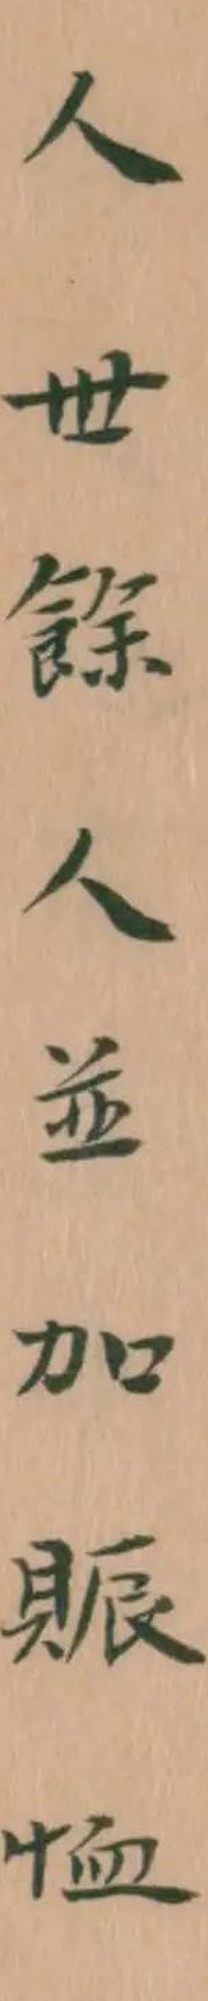人卅余人並加賑恤
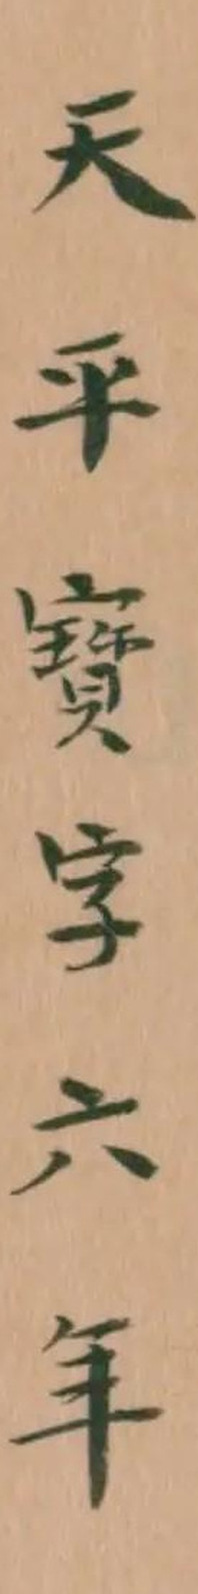天平宝字六年
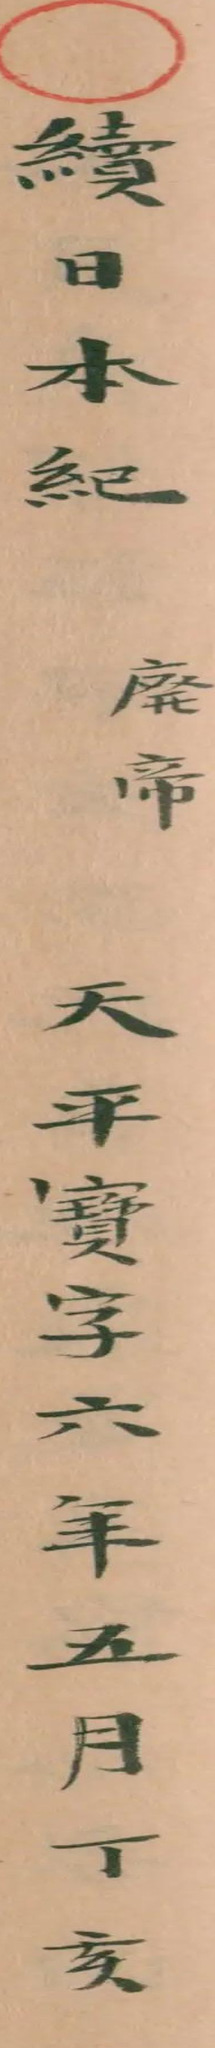○続日本紀廃帝天平宝字六年五月丁亥
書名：地災撮要. 巻5-6(地震之部)
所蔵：国立国会図書館 National Diet Library, JAPAN
